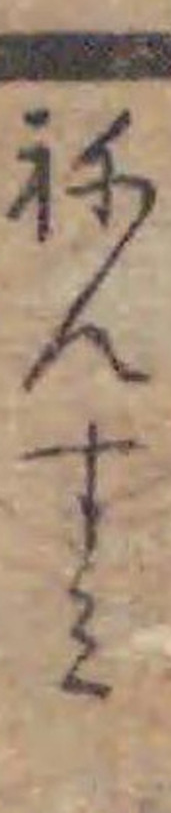ねんすみ
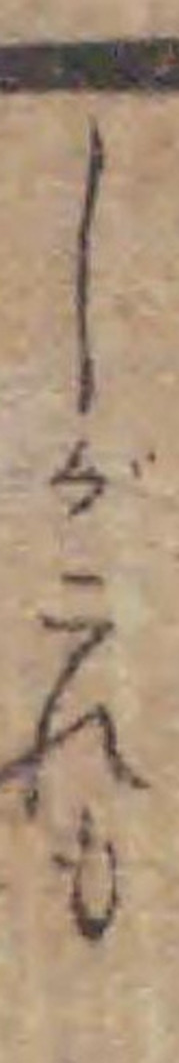しがこれも
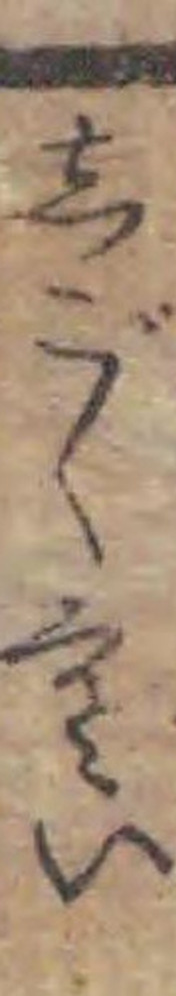しごく寒い
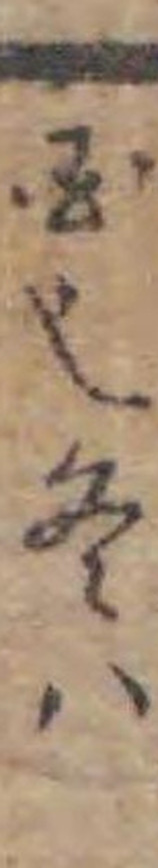国也冬は
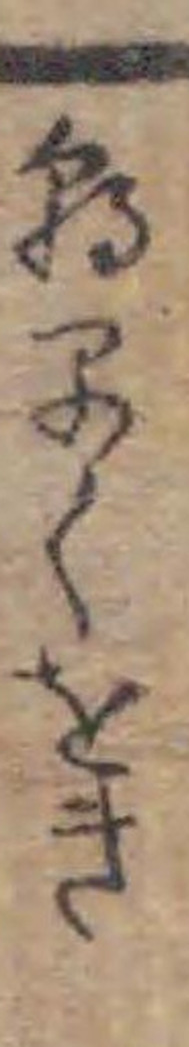朝早くをき
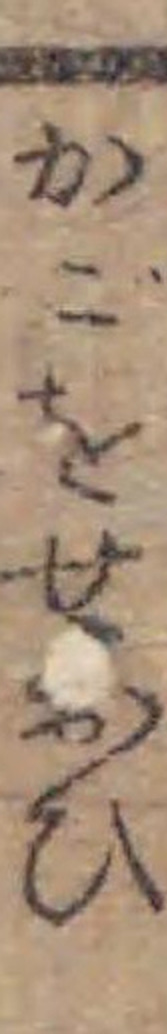かごをせおひ
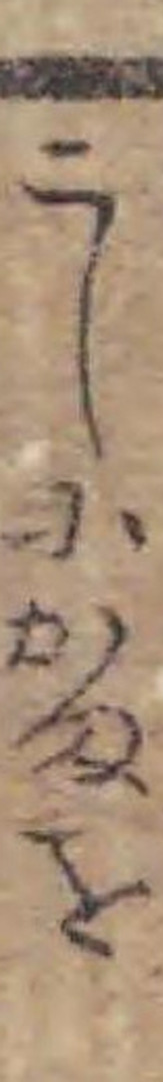こしにかまを
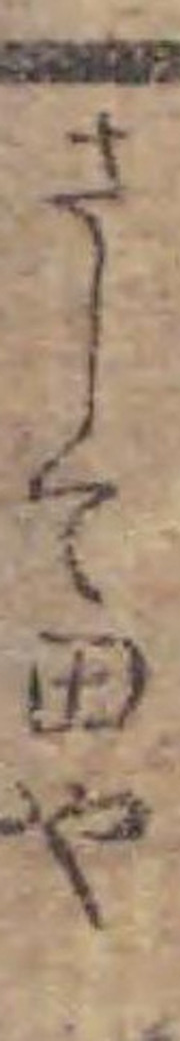さして田や
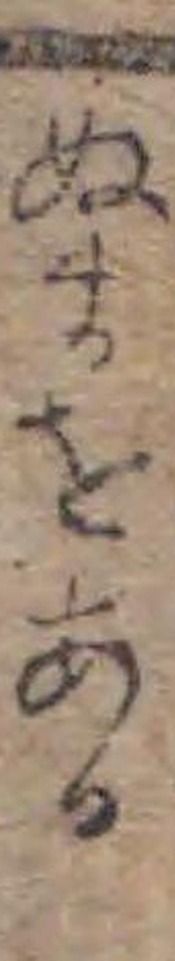ぬまをある
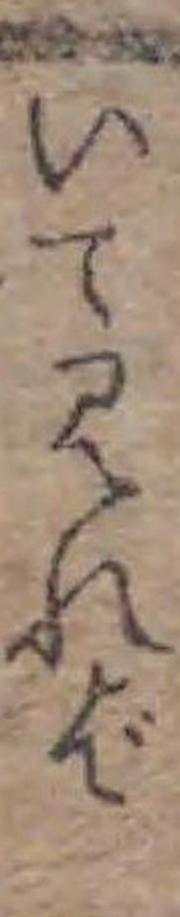いて見れば
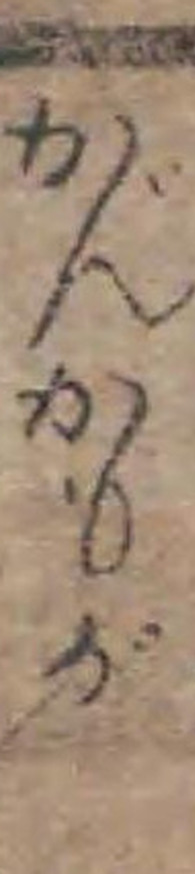がんかもが
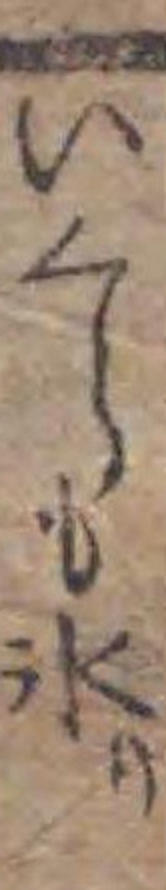いくらも氷り
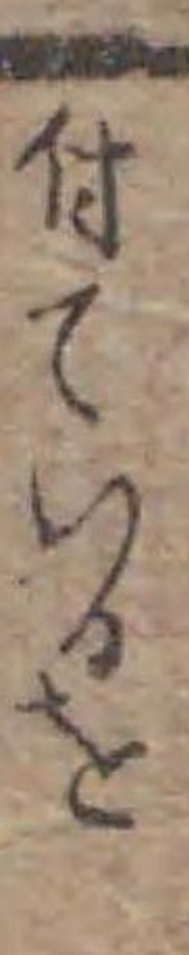付ているを
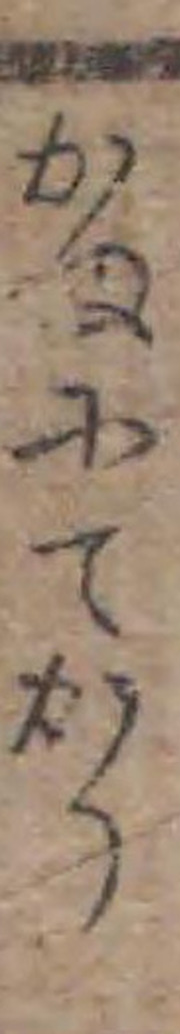かまにてかり
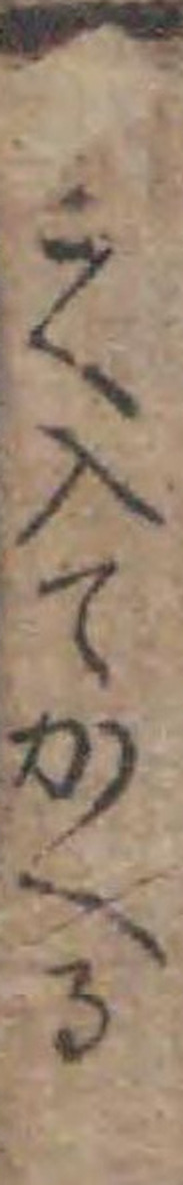こへ入てかへる
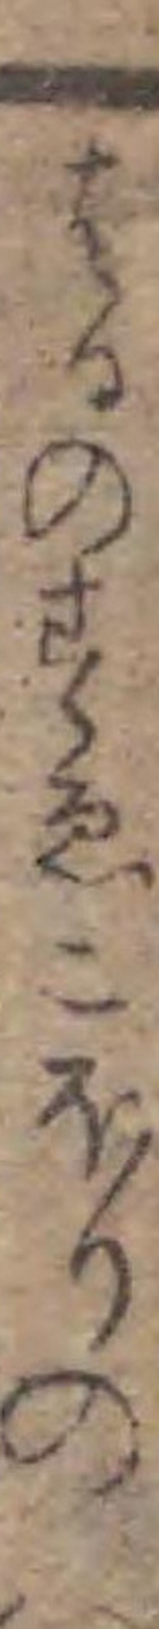はるのすゑこほりの
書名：虚言八百万八伝 : 3巻
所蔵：国立国会図書館 National Diet Library, JAPAN
